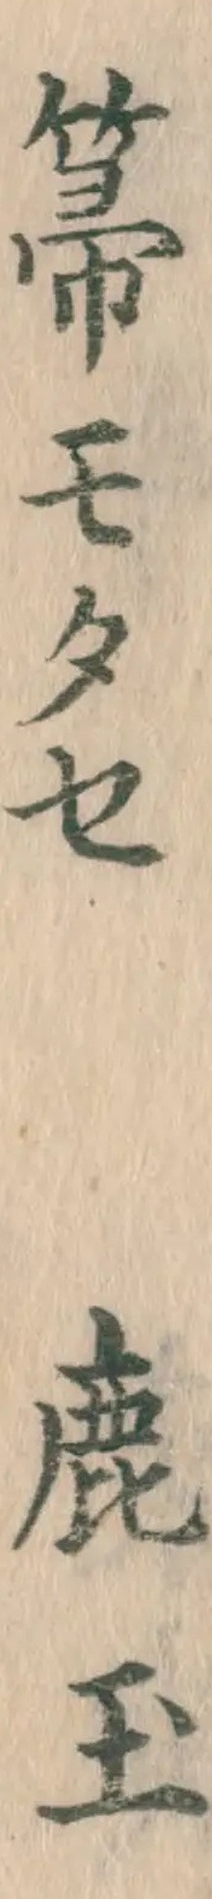箒モタセ鹿玉
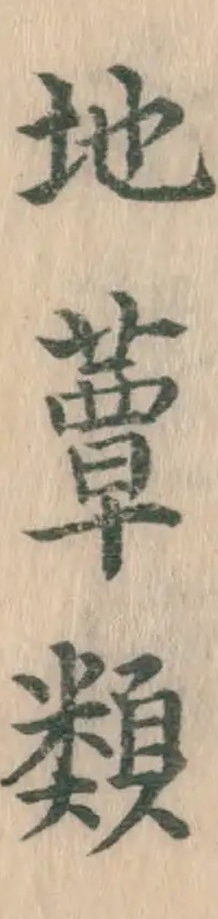地蕈類
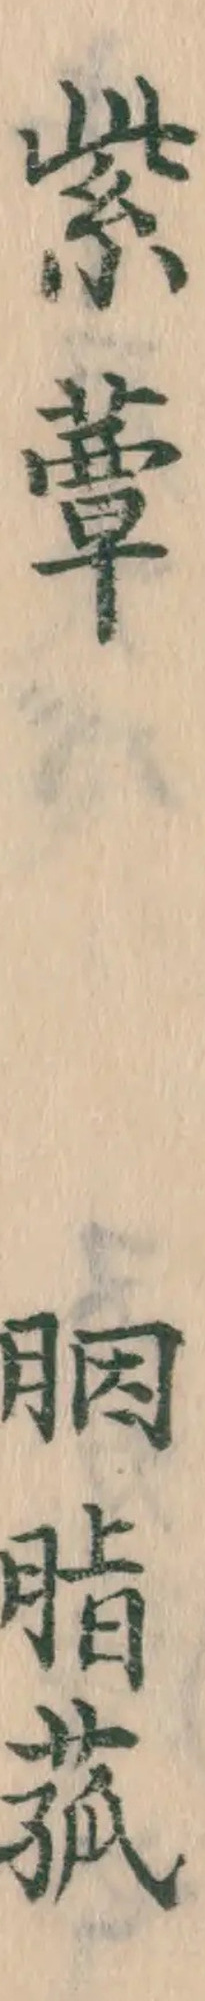紫蕈臙脂菰

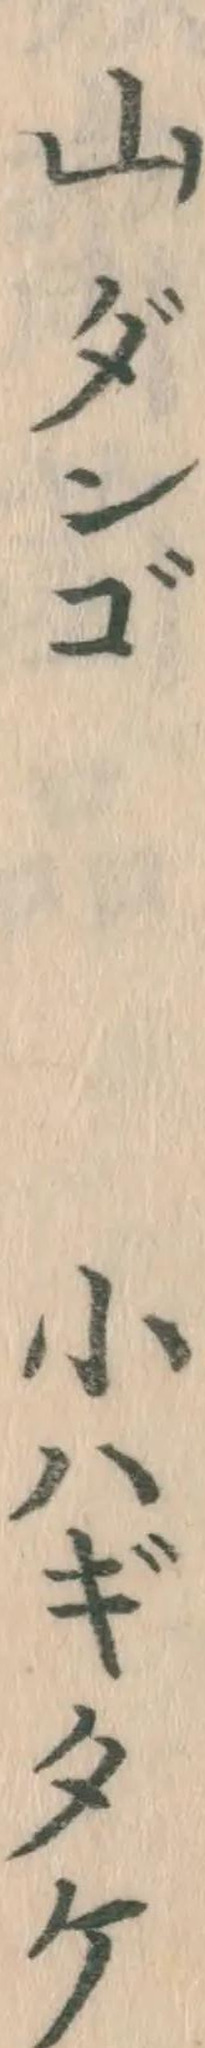山ダンゴ小ハギタケ
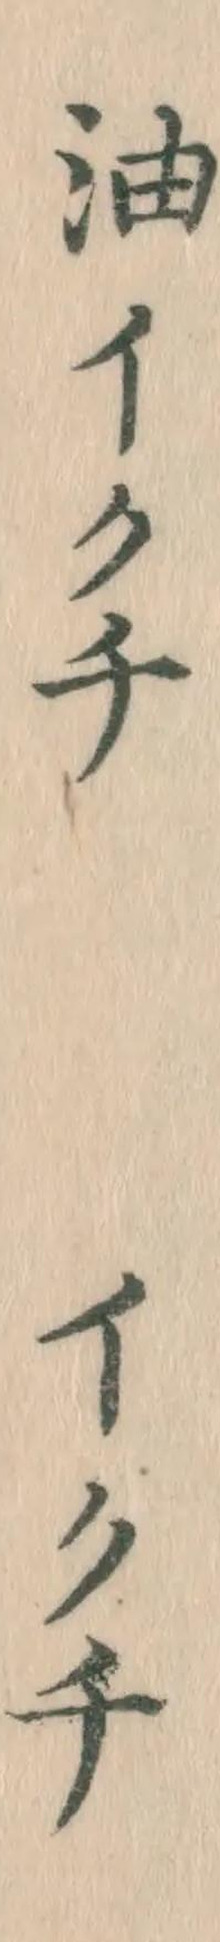油イクチイクチ
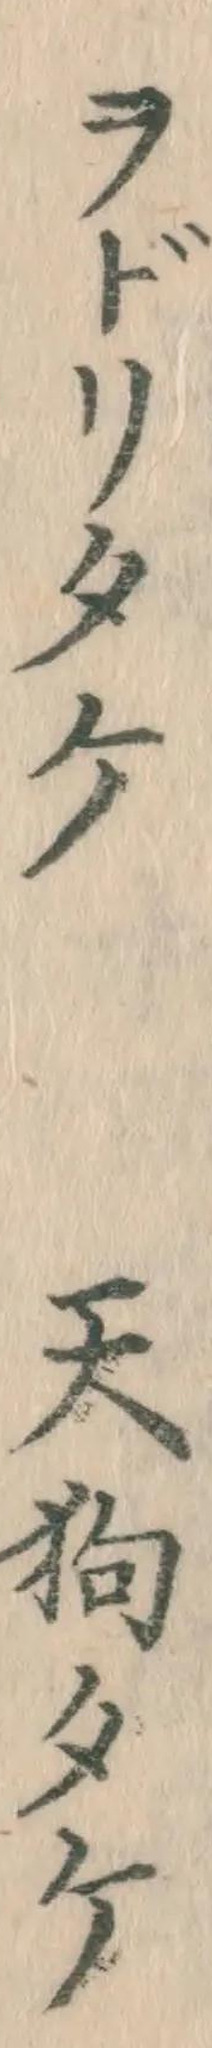ヲドリタケ天狗タケ
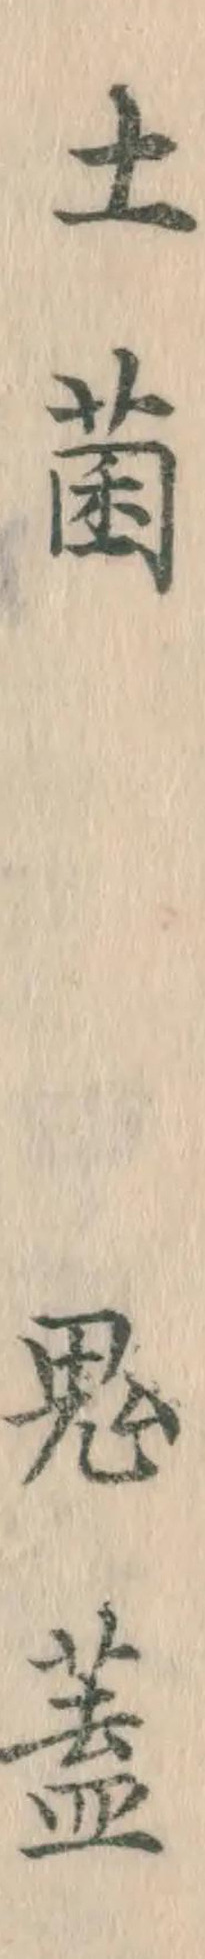土菌鬼蓋
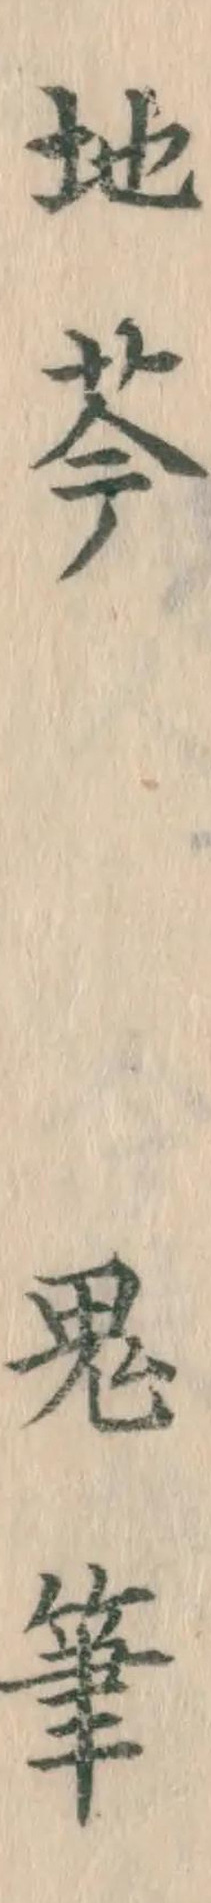地芩鬼筆
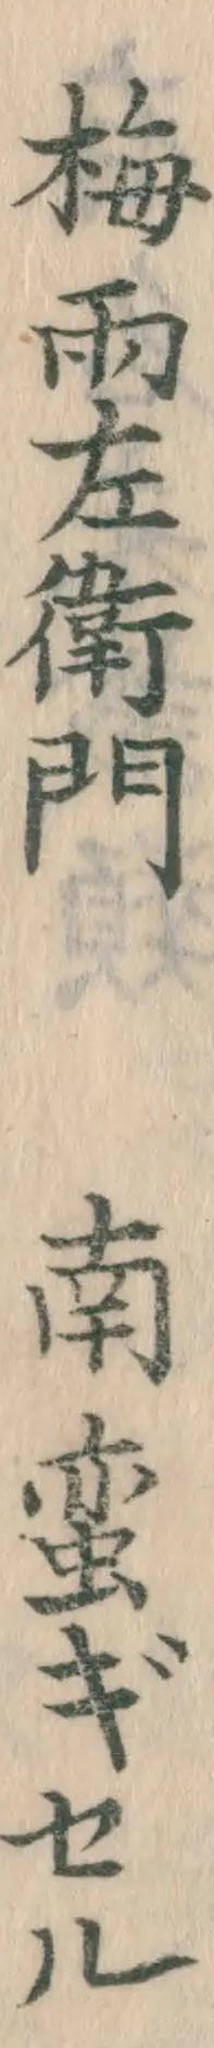梅雨左衛門南蛮ギセル
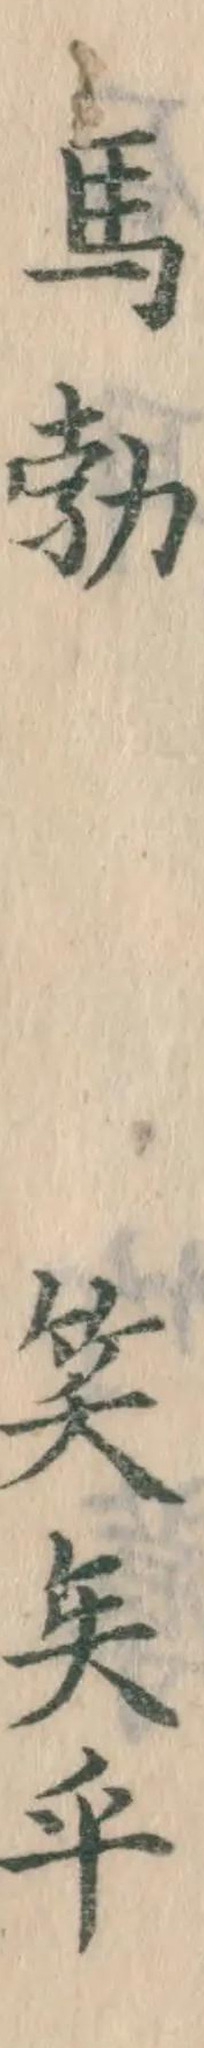馬勃笑矣乎

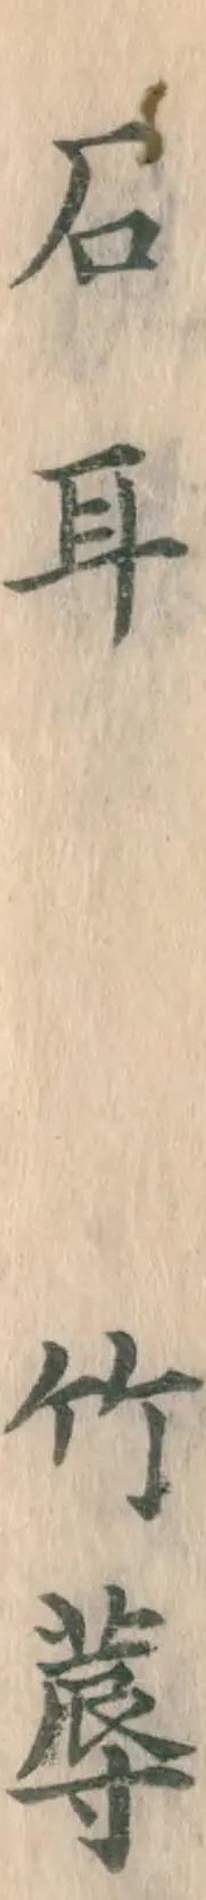石耳竹蓐
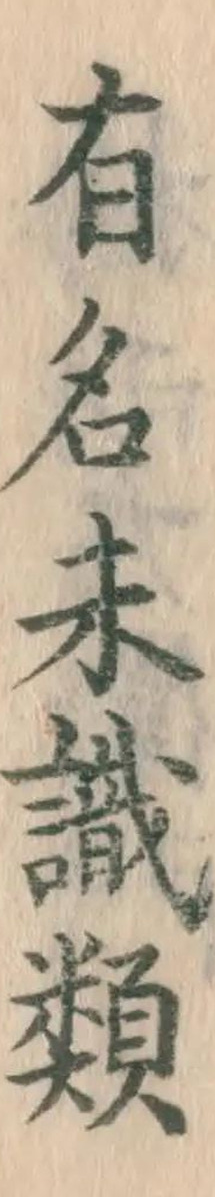有名未識類
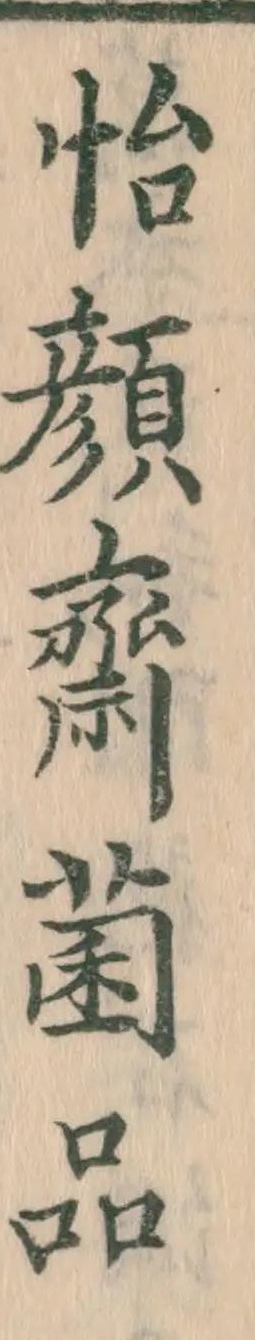怡顔斎菌品
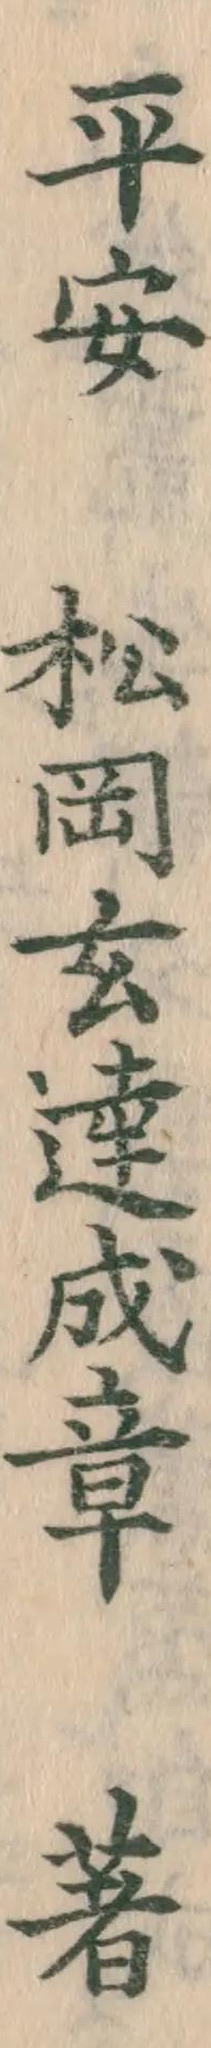平安松岡玄達成章著
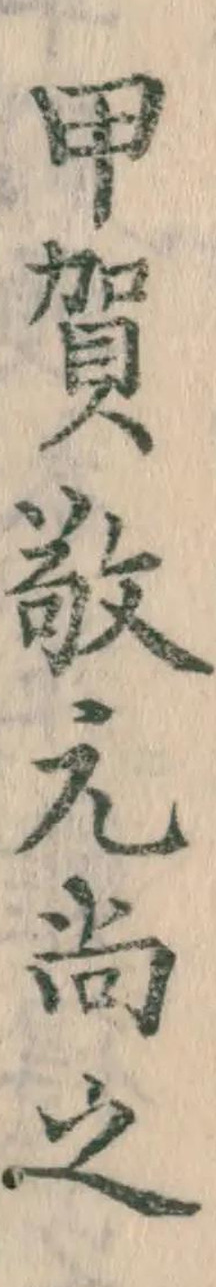甲賀敬元尚之
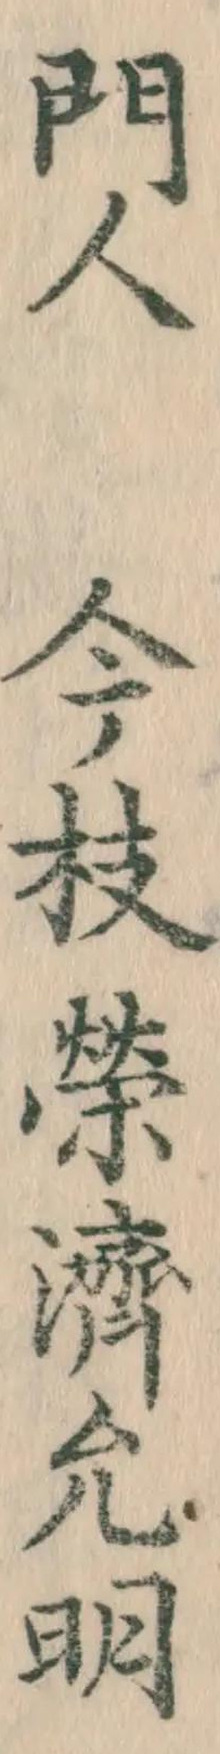門人今枝栄済允明
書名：怡顔斎菌品 2巻
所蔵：国立国会図書館 National Diet Library, JAPAN
